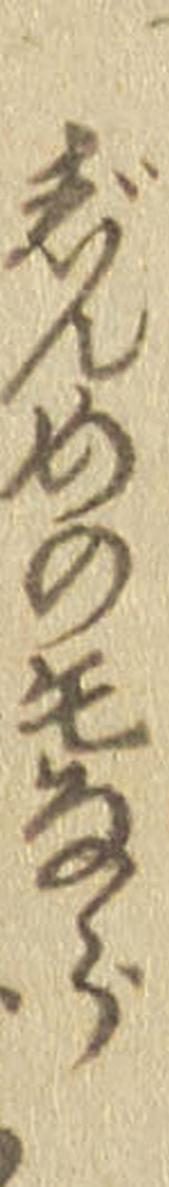じんめの毛なら
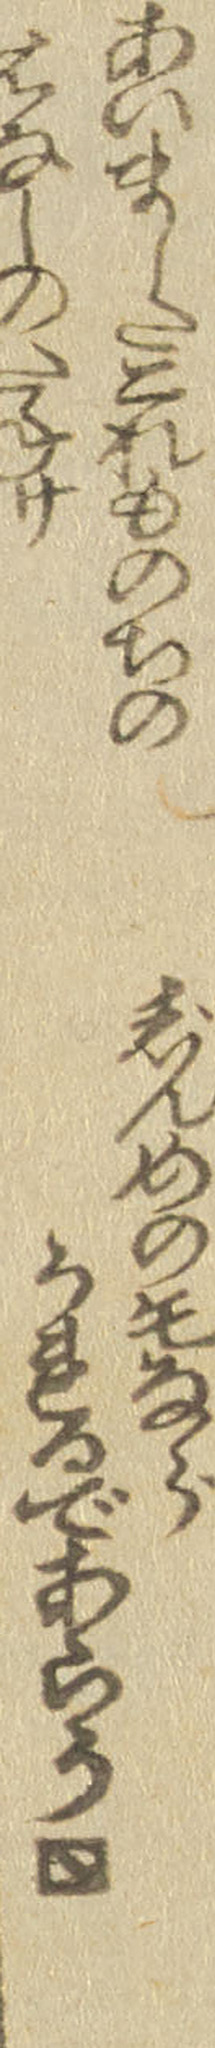あいましたこれものちの
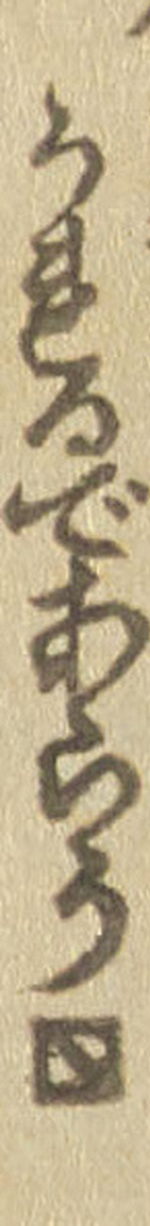うれるであらう
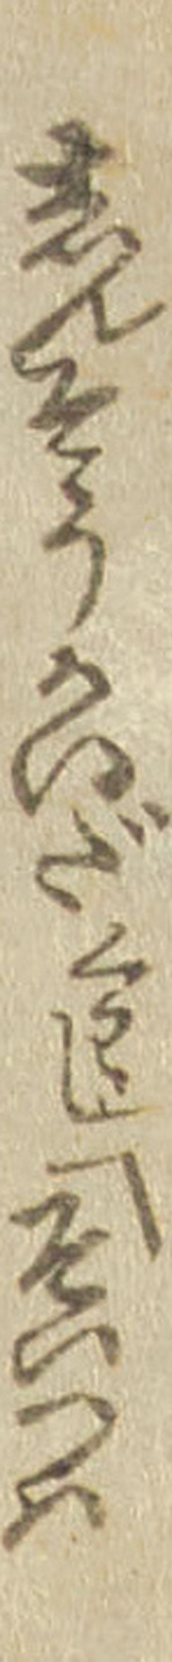しんそうかいだくわじ「そいつは
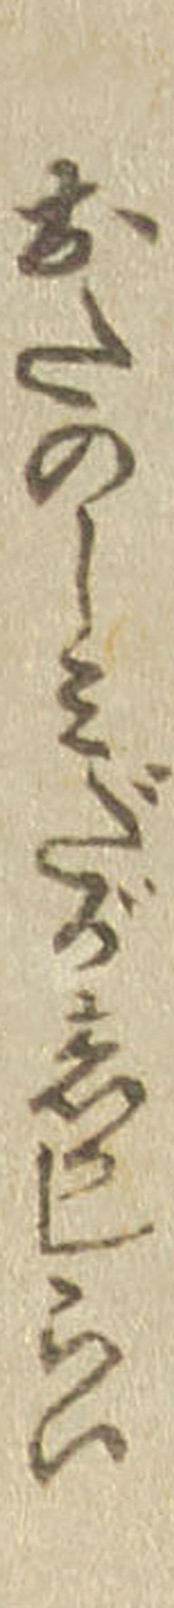おたのしみだがしかしらい
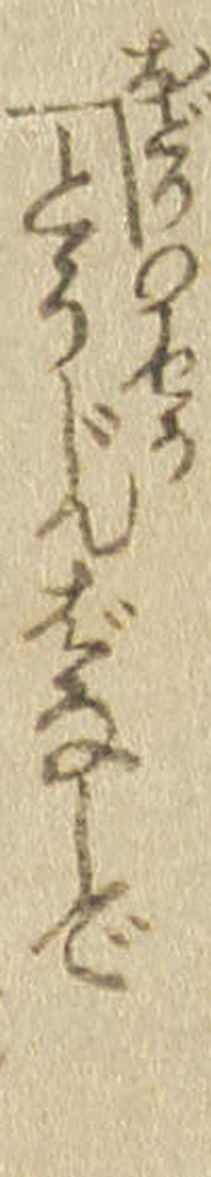「とうじんばなしで
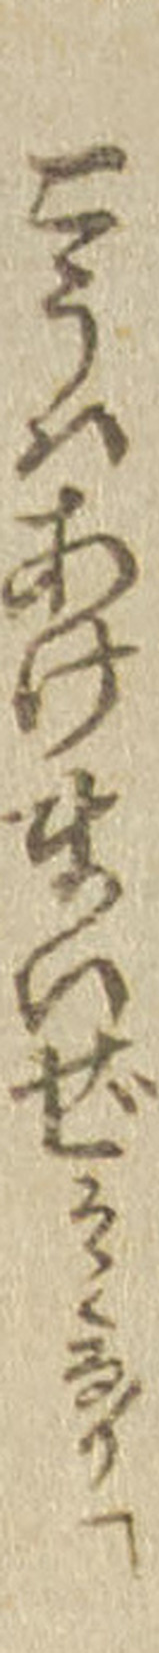こうはあけまいぜかみなり「
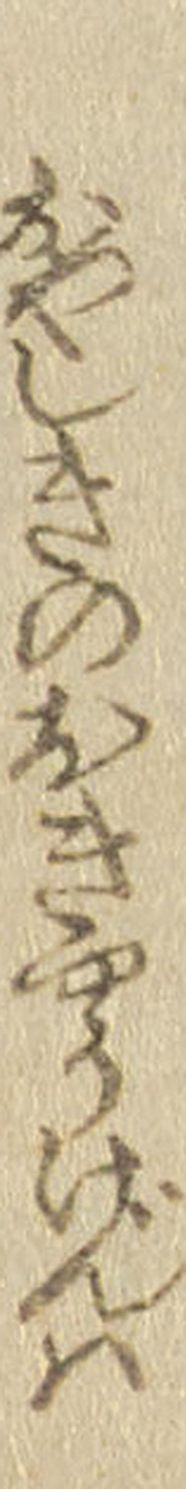おやしきのおきやうげんは
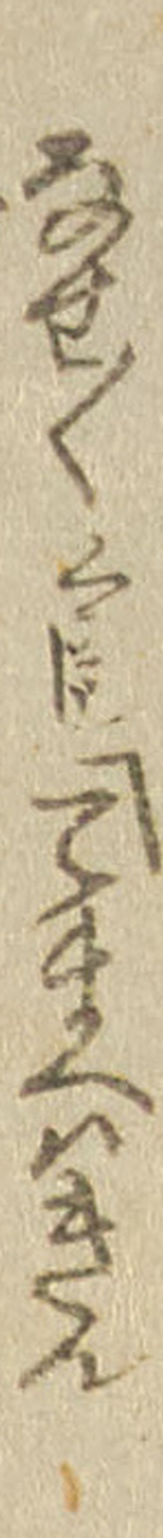なせ〳〵くわじ「てまへはきん
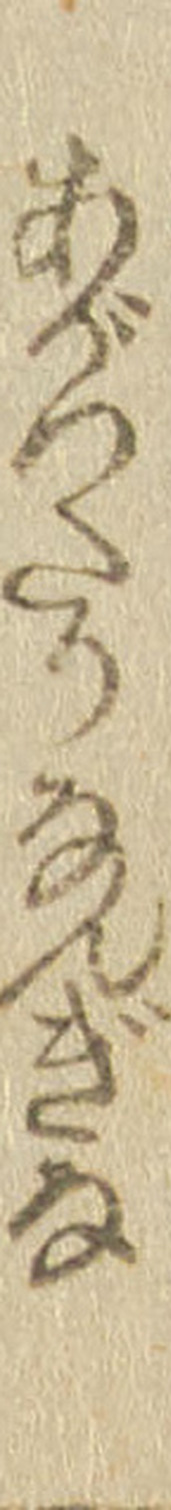あがつたりなんぎな
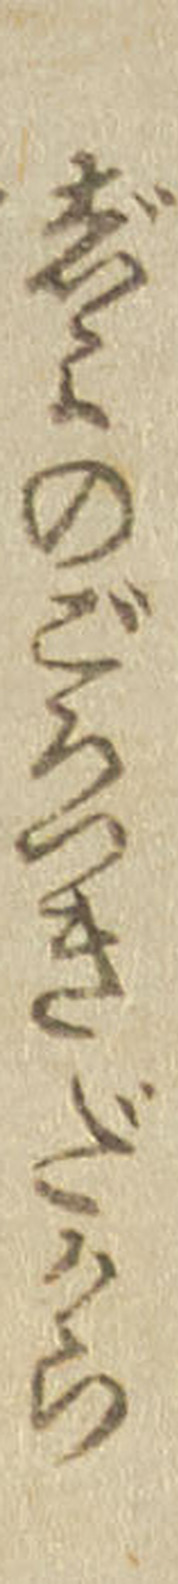じよのごろつきだから
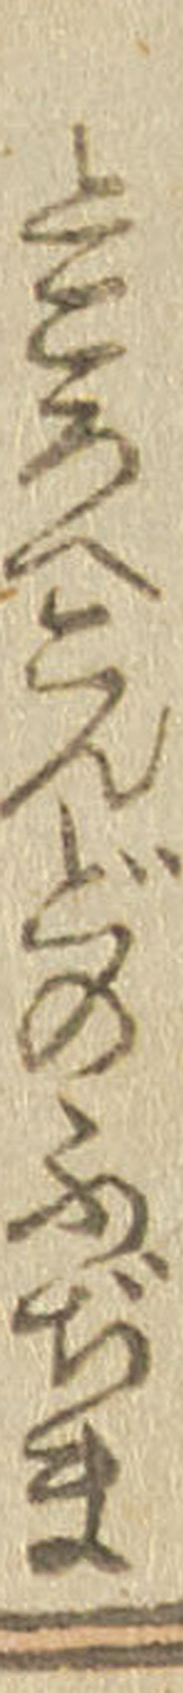ところへこんどのふぢま
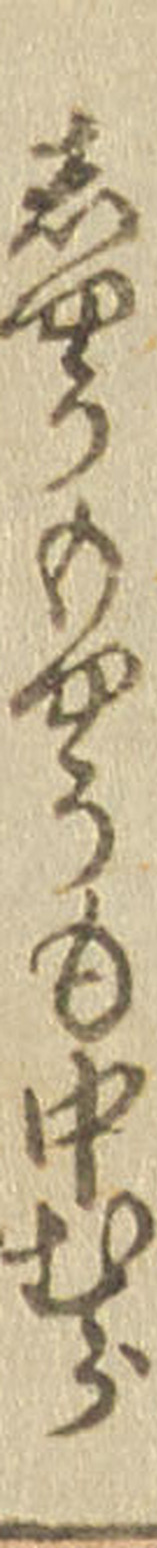しやうもやうも中むら
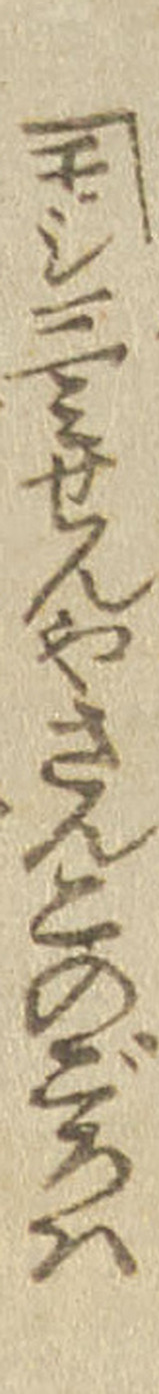「もし三みせんやさんこのごろは
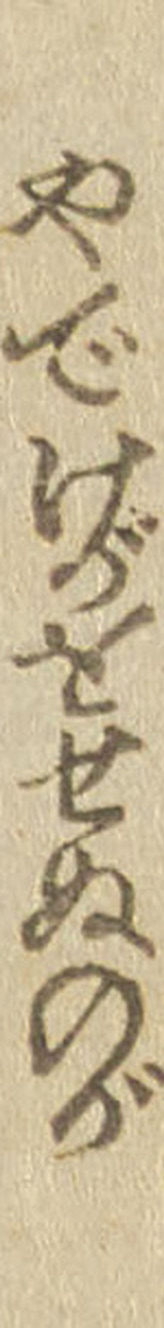やでけがをせぬのが
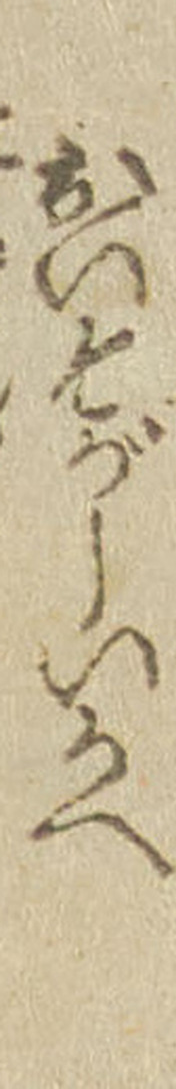おいそがしいかへ
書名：骨抜どうせうなまづ大家破焼
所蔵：東京大学総合図書館 General Library in the University of Tokyo, JAPAN
